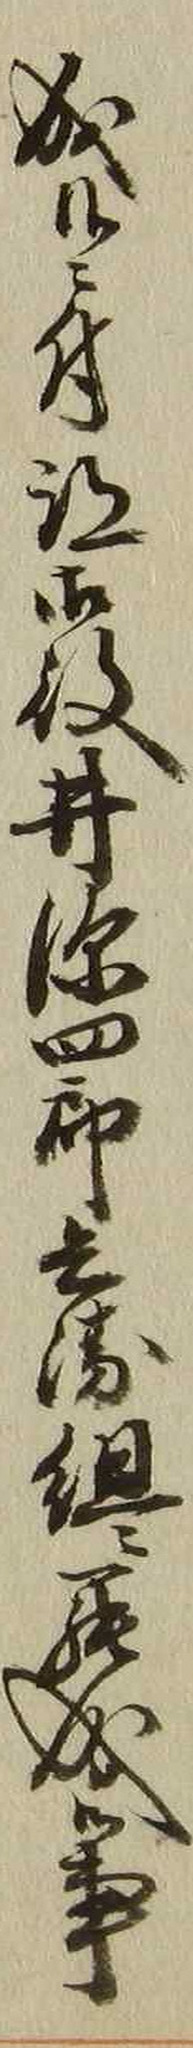成候ニ付跡御役井深四郎兵衛組ニ罷成候事
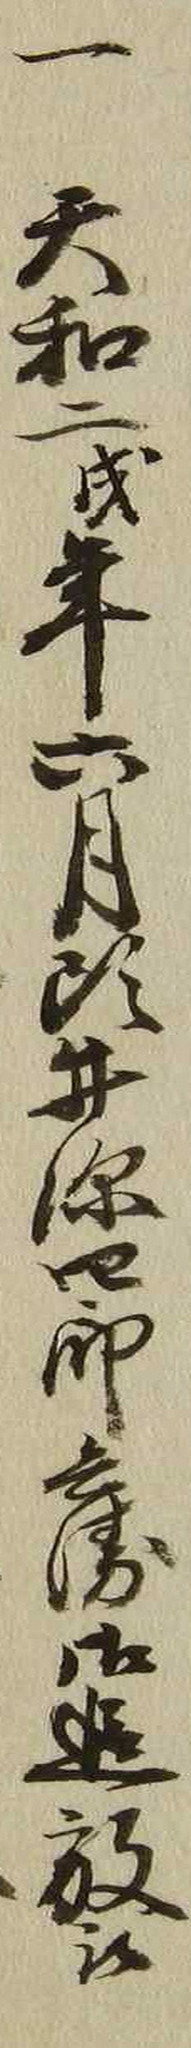一天和二戌年六月頭井深四郎兵衛御追放被
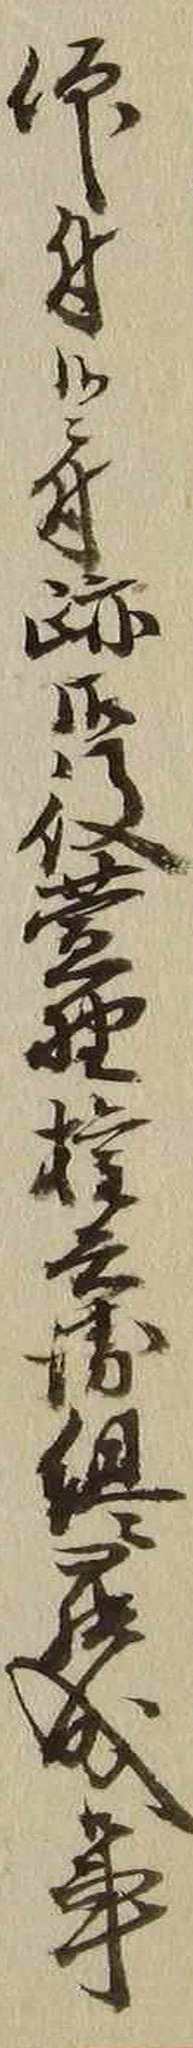仰付候ニ付跡御役菅野権兵衛組ニ罷成候事
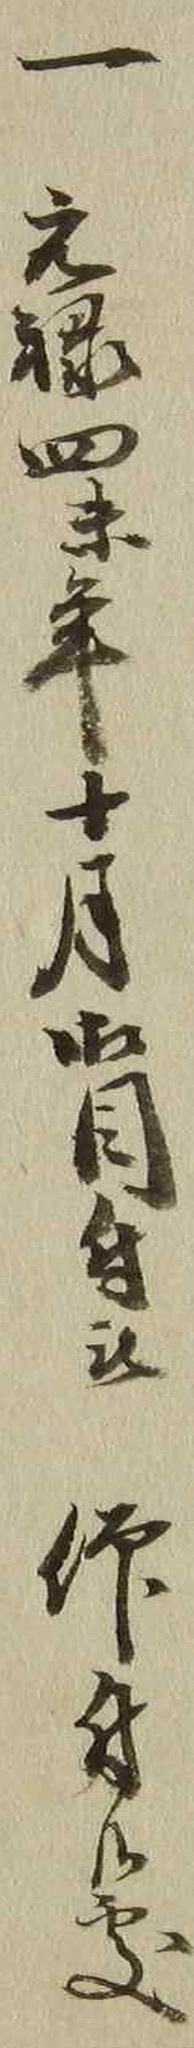一元禄四未年十月御目付被仰付候處
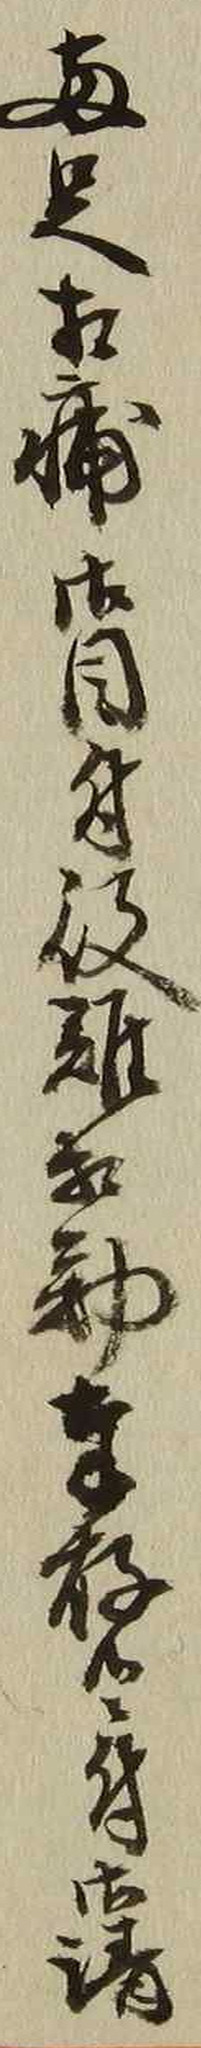両足相痛御目付役難相勤放候ニ付御請
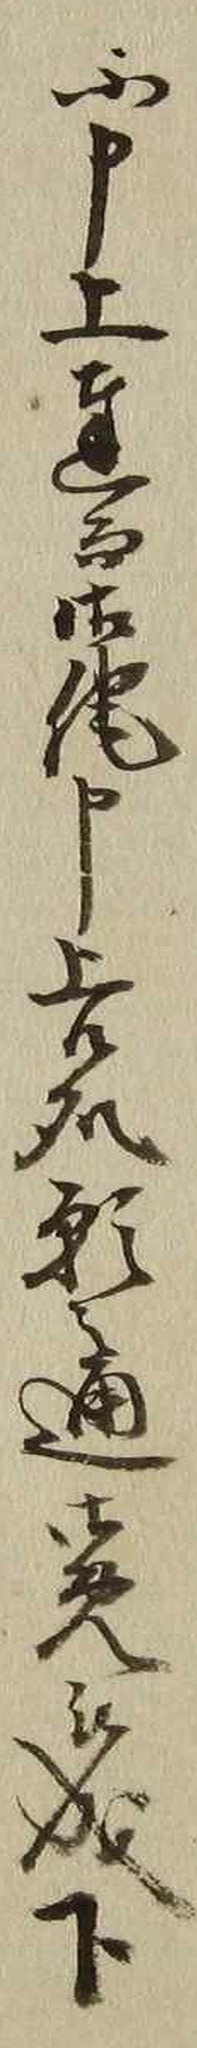不申上達而御侘申上候処願之通御免被成下
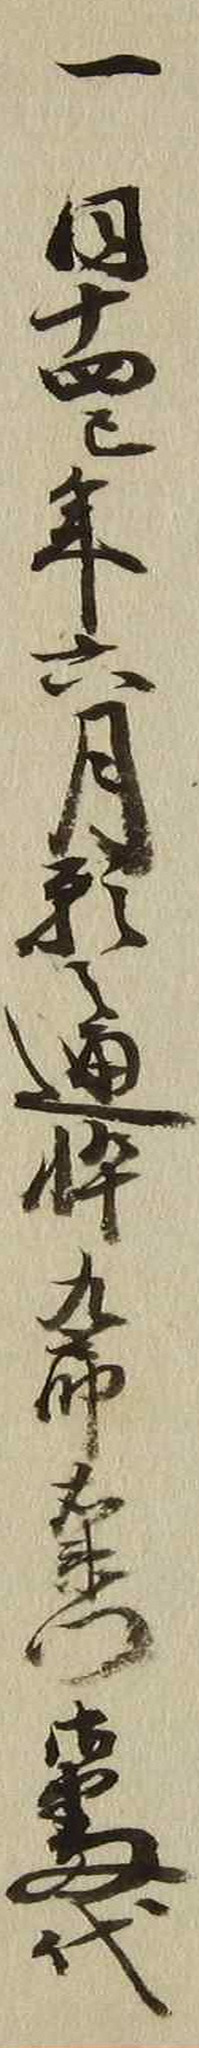一同十四巳年六月願之通忰九郎右衛門御番代
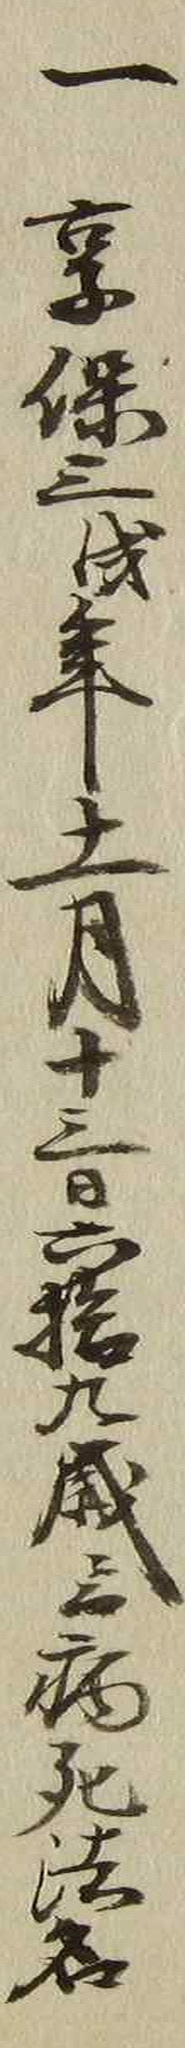一享保三戌年十一月十三日六拾九歳ニ而病死法名
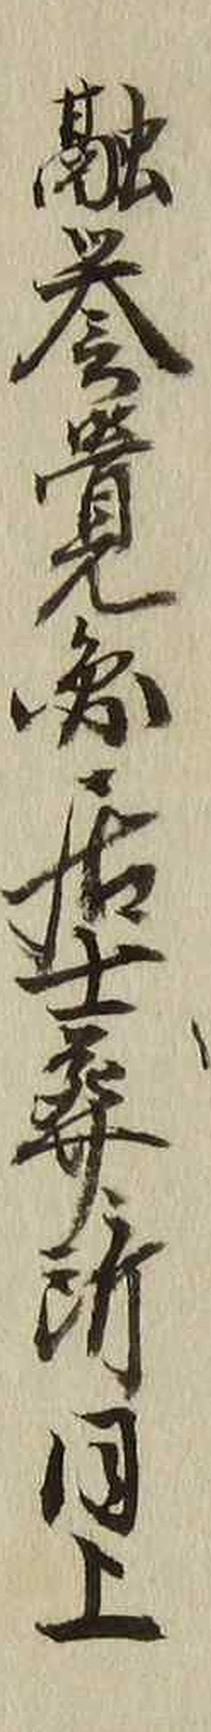融誉覚円居士葬所同上
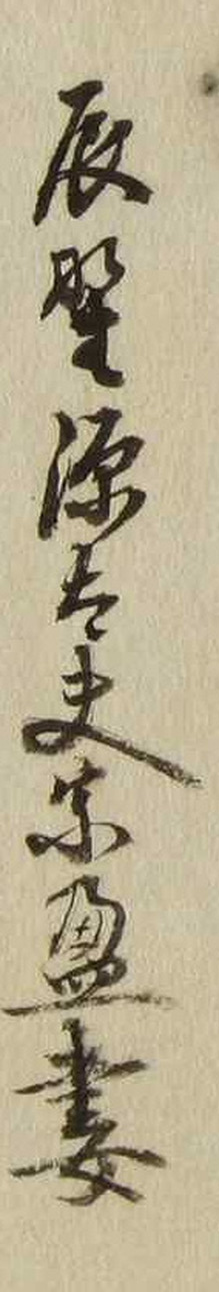女辰野源太夫宗盈妻
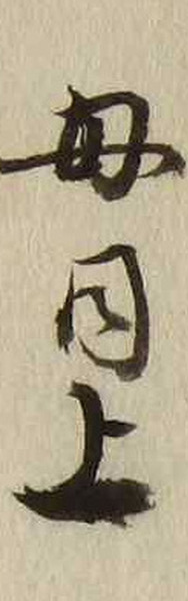母同上

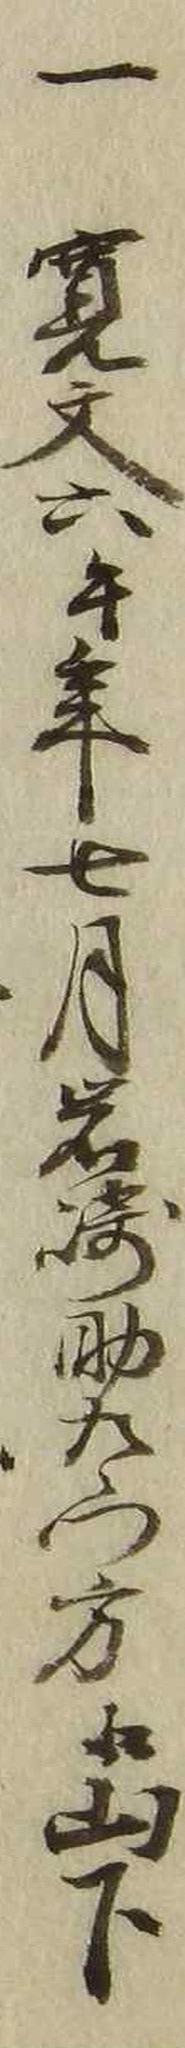一寛文六丑年七月岩崎助九エ門方江山下
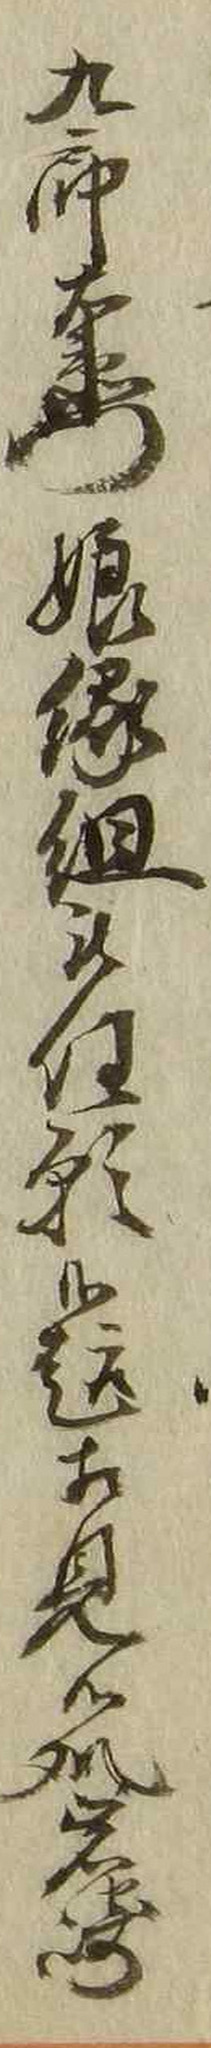九郎右衛門娘縁組被任願候趣相見候処岩崎
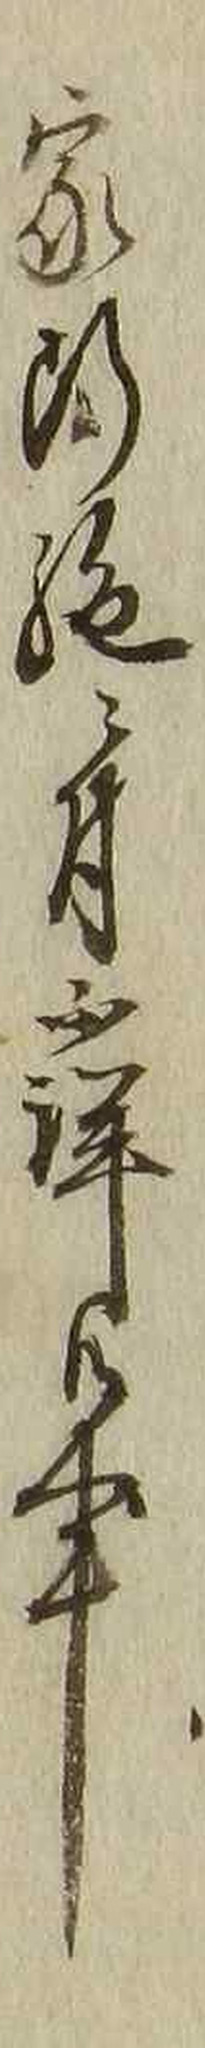家断絶ニ付不詳候事
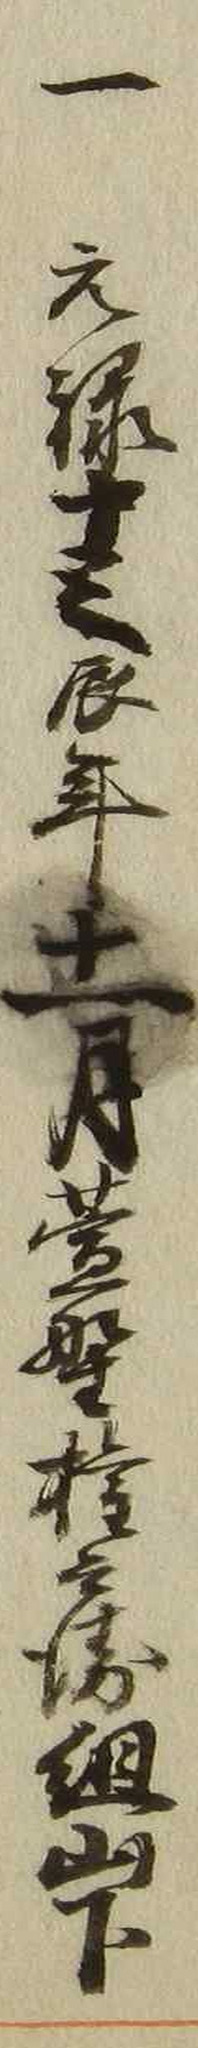一元禄十三辰年十一月茅野権兵衛組山下
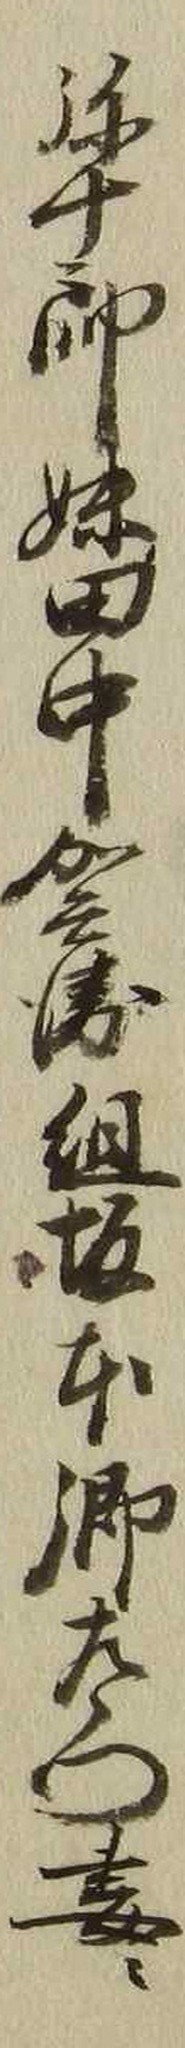弥十郎妹田中加兵衛組坂本郷左衛門妻ニ
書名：諸士系譜　巻之64　と之部7
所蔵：会津若松市立会津図書館
